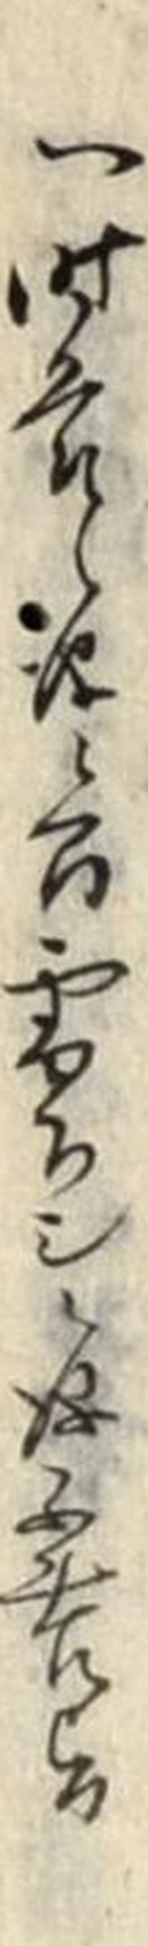一時節之儀候間雪下シ之儀不苦旨
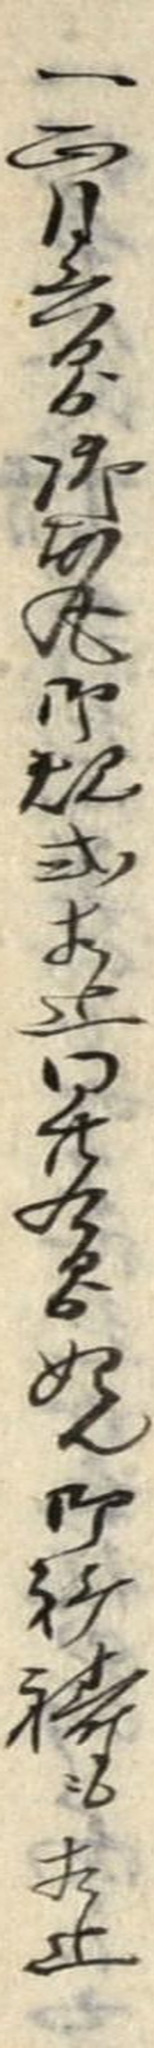一正月六日ゟ御本丸御規式相止同廿九日ゟ始ル御祈祷も相止

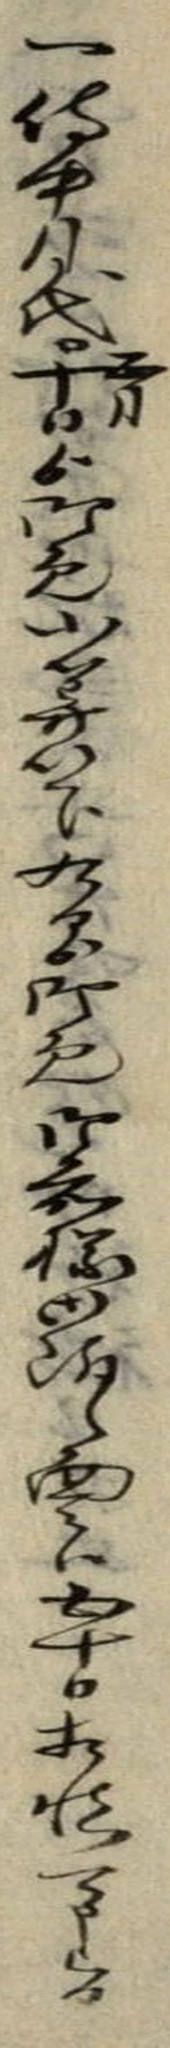一侍中月代◦正月十日ゟ御免小算以下九日ゟ御免御前様御附之面々は五十日相慎可申旨
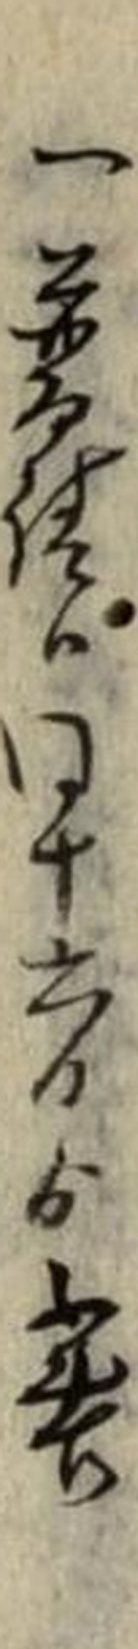一普請は同十六日ゟ不苦
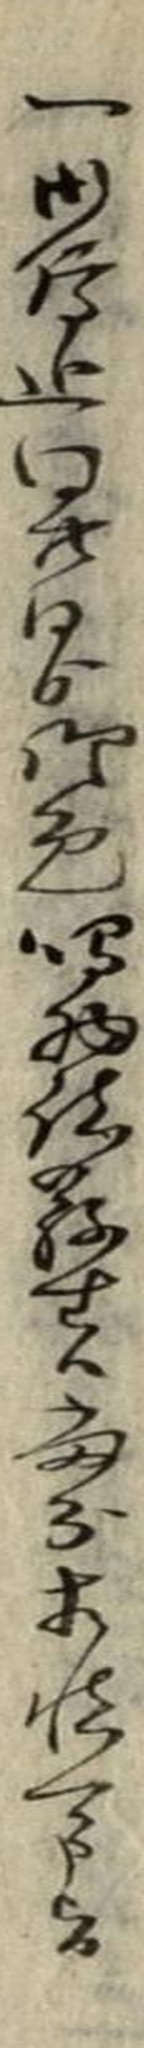一御停止同廿日ゟ御免鳴物諸殺生は当分相慎可申旨
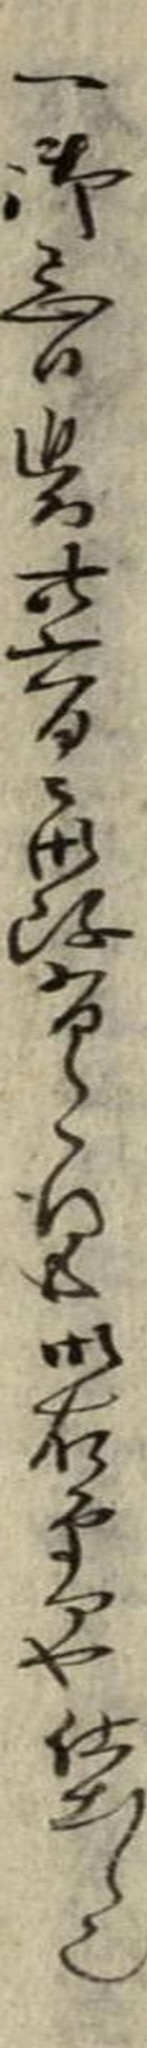一御忌日追て廿六日に御改有之候得共御右筆部や仕出し也
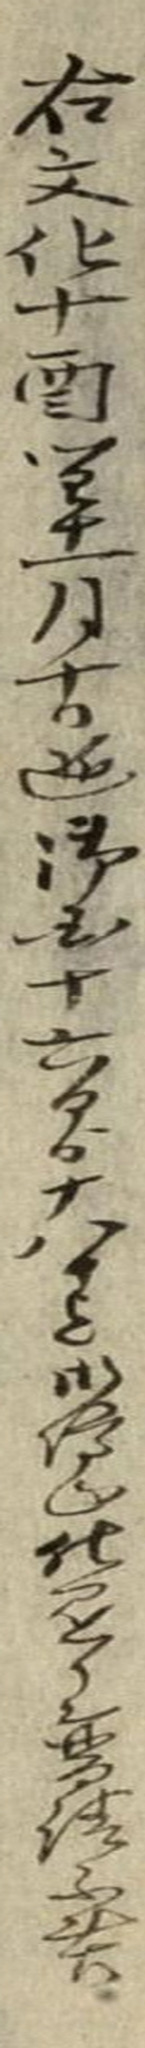右文化十酉閏十一月十日逝御国十六日ゟ十八日迄御停止仕懸り普請不苦
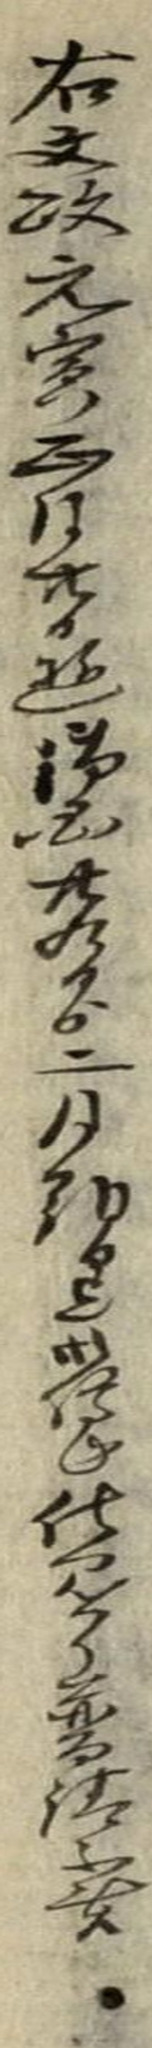右文政元寅正月廿日逝御国廿九日ゟ二月朔日迄御停止仕懸り普請不苦
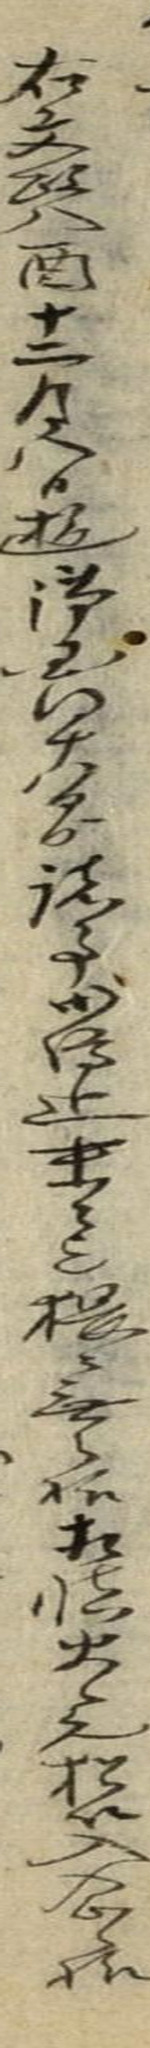右文政八酉十二月八日逝御国同十八日ゟ諸事御停止末々迄猥に無之様相慎火之元猶以入念候様
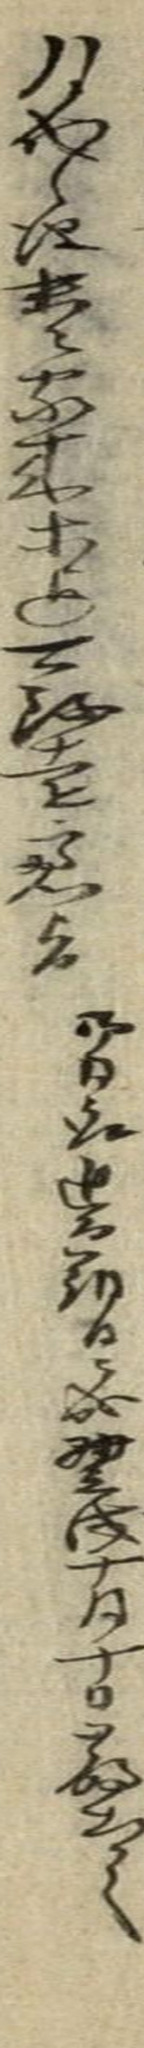月代之儀末々家来等迄可致遠慮旨御日取追て朔日に成翌戌十月十日御触出之
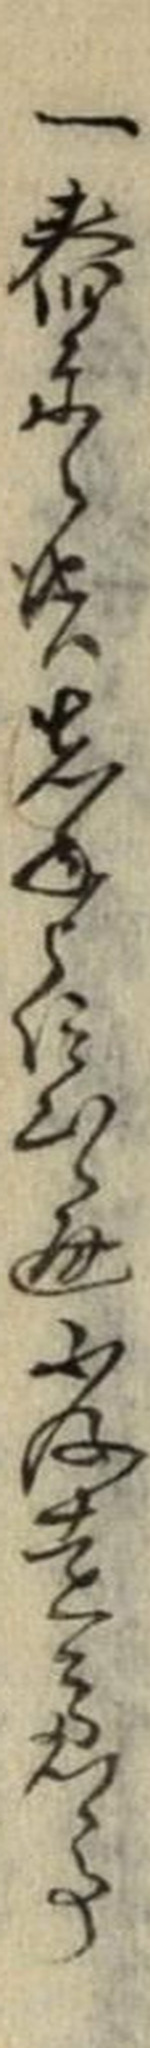一舂米之儀は先年被仰出候通不及遠慮候事
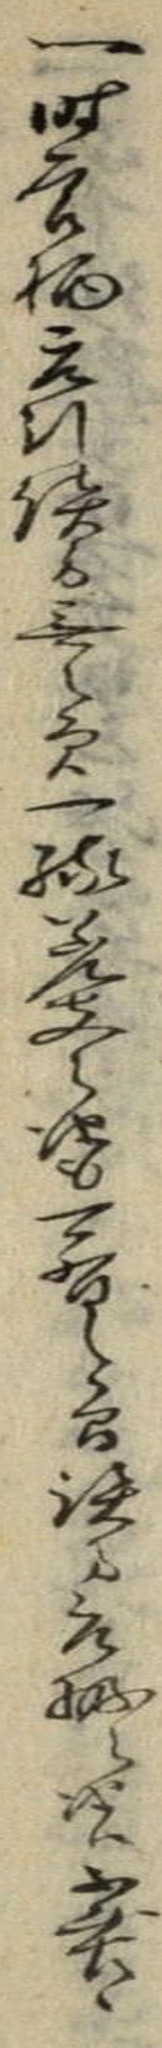一時節柄取引談方無之ては一縁差支之儀も可有之候間談方取扱之儀は不苦候
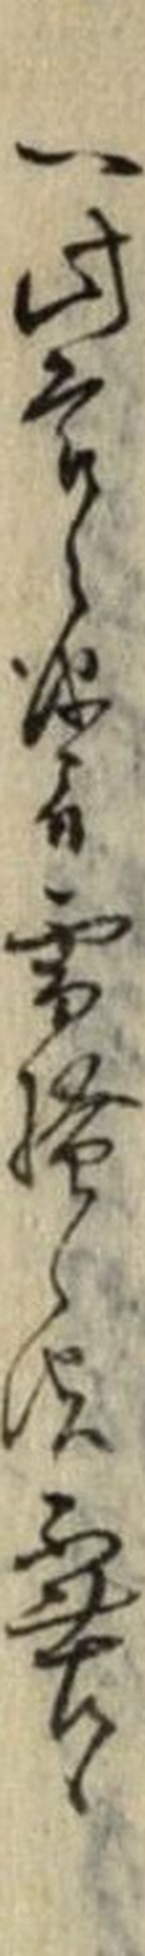一此節之儀に付雪掻之儀は不苦候
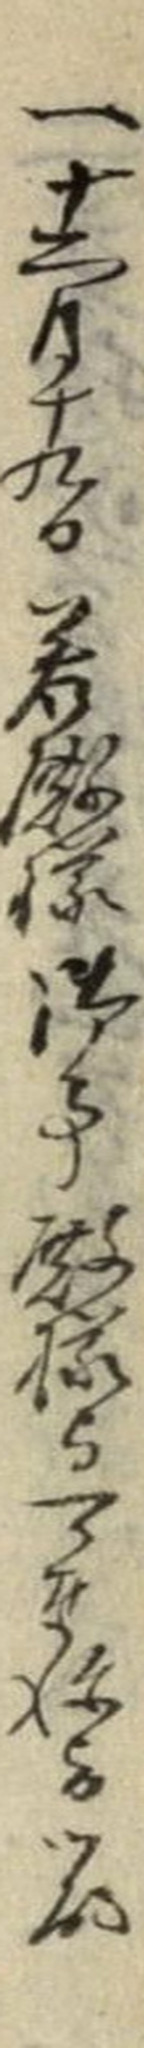一十二月十九日若殿様御事殿様と可奉称旨御触
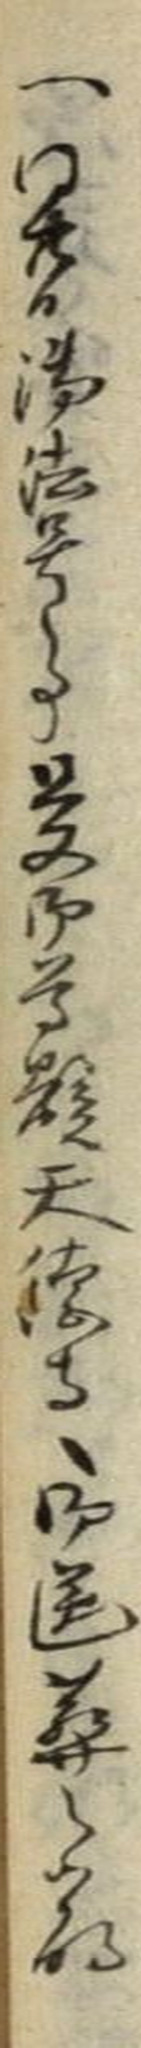一同廿日御法号之事且又御尊骸天徳寺へ御送葬之御触
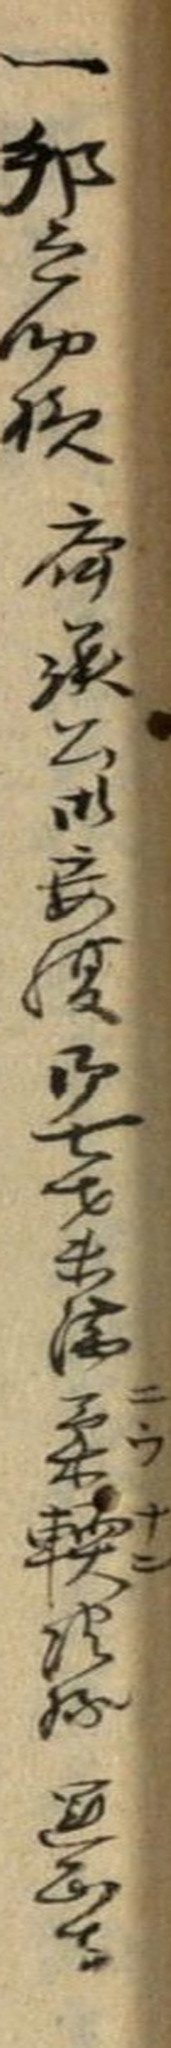一邦之助様斉承公御妾腹御七才未満柔輭院様運正寺
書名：御停止異変死失
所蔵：福井県文書館 Fukui Prefectural Archives
